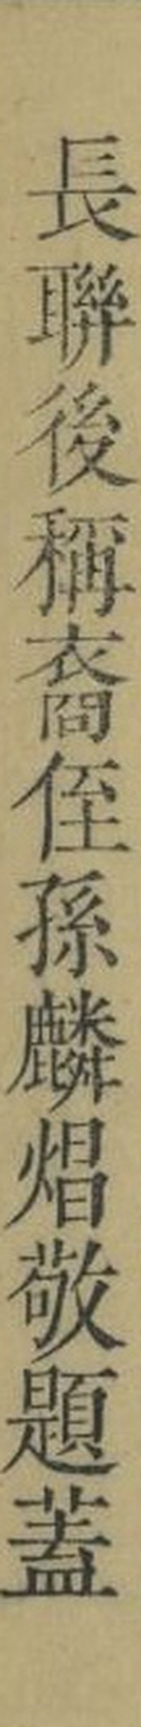長聯後稱裔侄孫麟焻敬題蓋

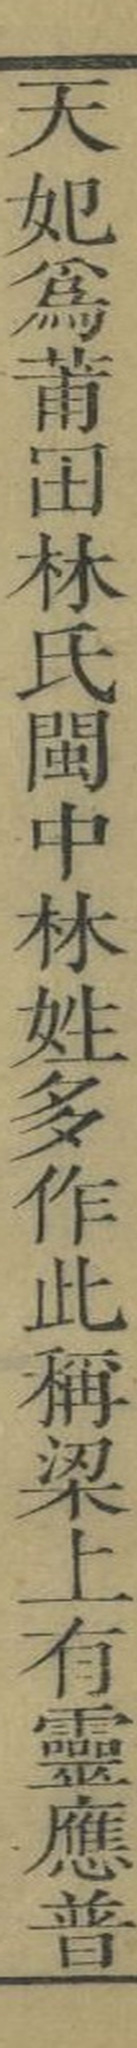天妃爲莆田林氏閩中林姓多作此稱梁上有靈應普
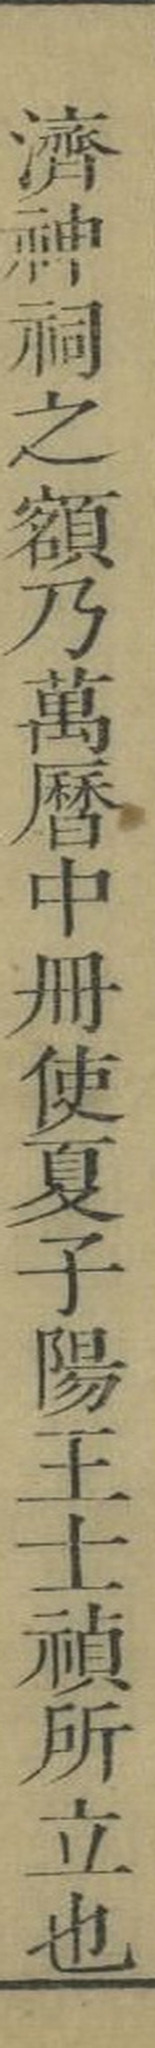濟神祠之額乃萬曆中冊使夏子陽王士禎所立也
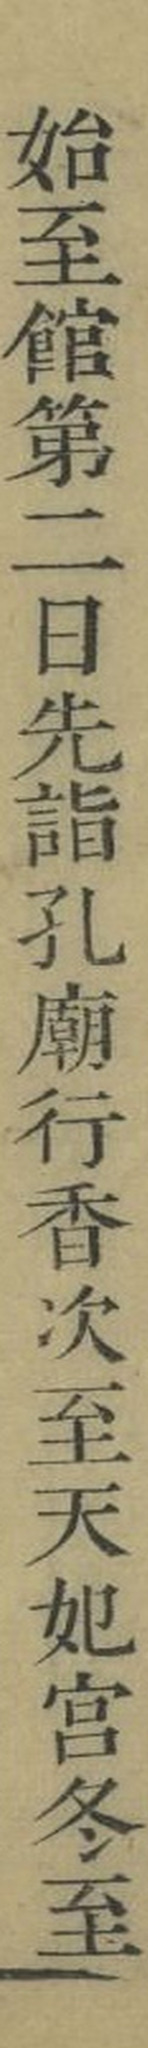始至館第二日先詣孔廟行香次至天妃宫冬至
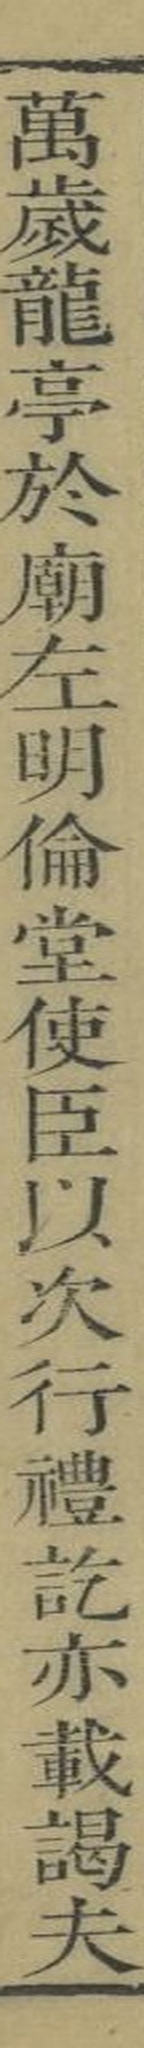萬歲龍亭於廟左明倫堂使臣以次行禮訖亦載謁夫
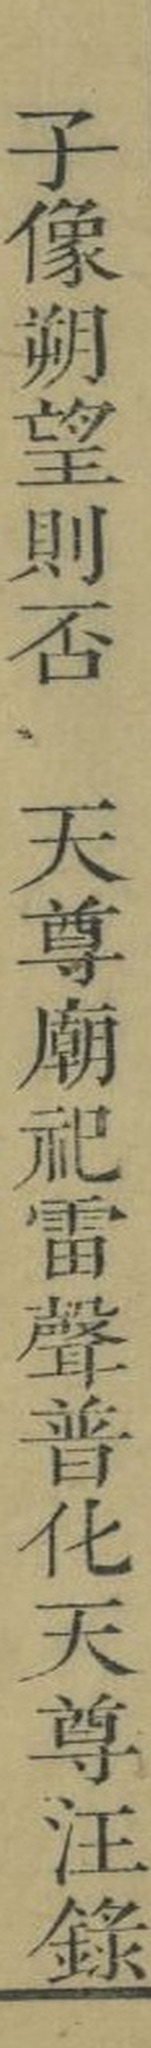子像朔望則否天尊廟祀雷聲普化天尊汪錄
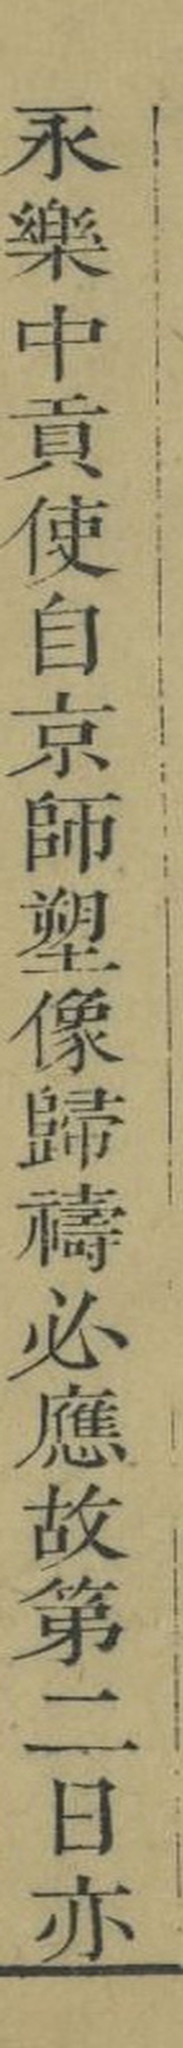永樂中貢使自京師塑像歸禱必應故第二日亦
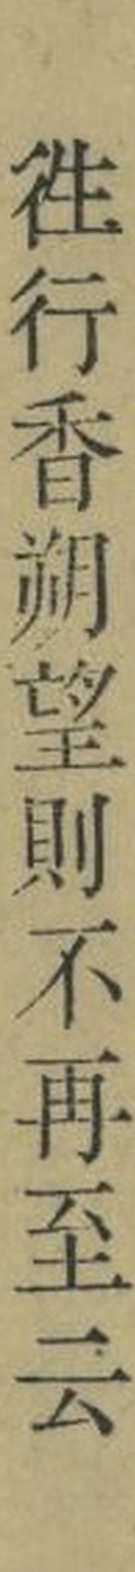徃行香朔望則不再至云

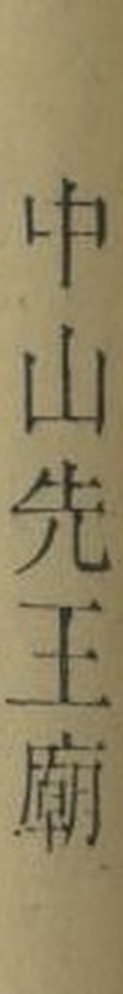中山先王廟
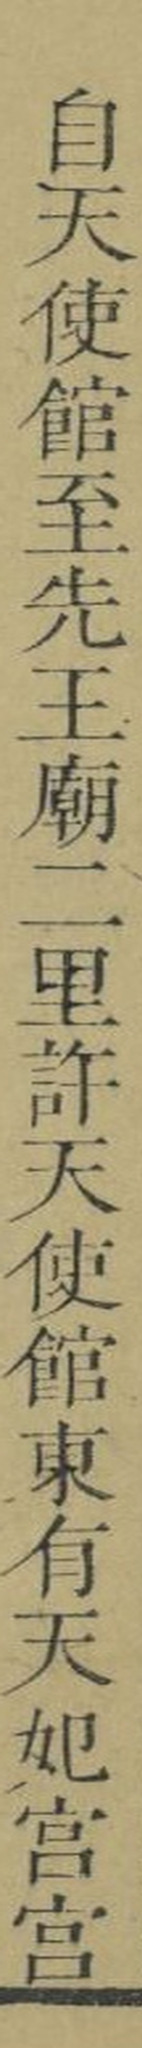自天使館至先王廟二里許天使館東有天妃宫宫
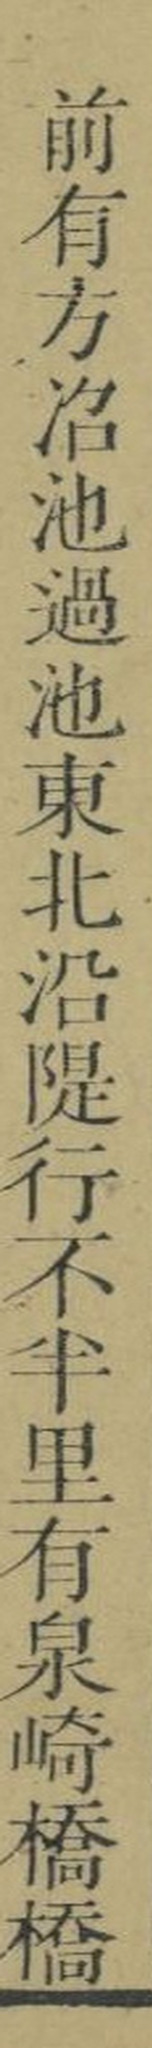前有方沼池過池東北沿隄行不半里有泉崎橋橋
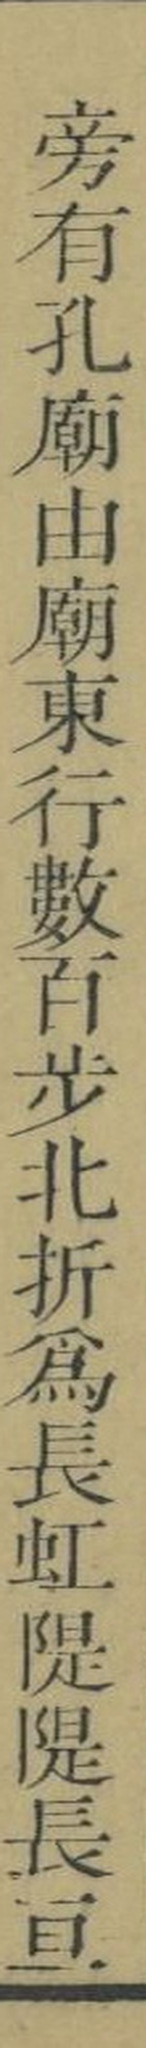旁有孔廟由廟東行數百步北折爲長虹隄隄長亘
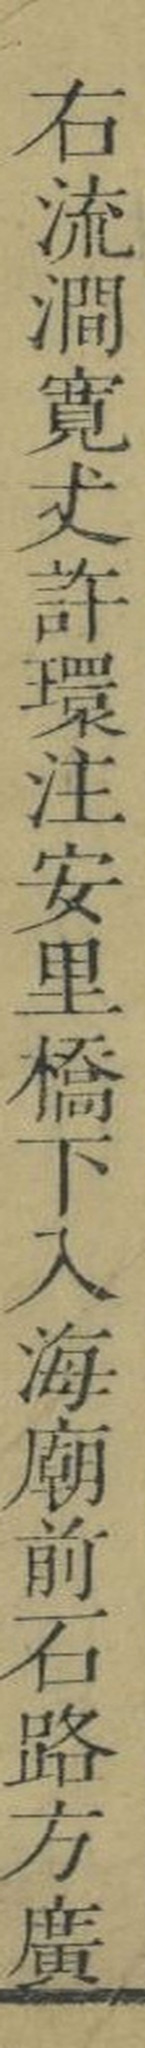右流澗寛丈許環注安里橋下入海廟前石路方廣
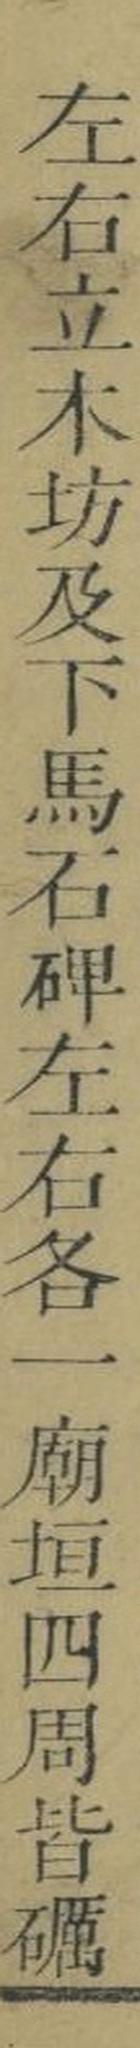左右立木坊及下馬石碑左右各一廟垣四周皆礪

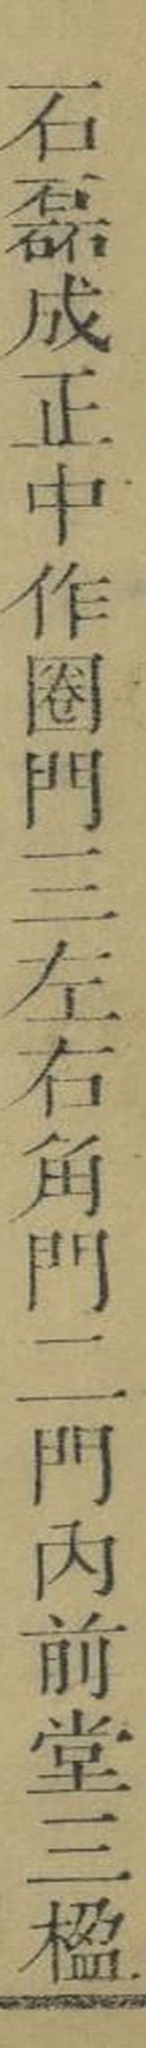石磊成正中作圏門三左右角門二門内前堂三楹
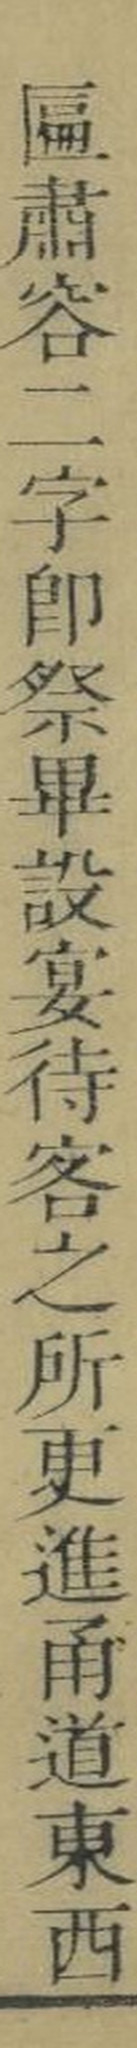匾肅容二字卽祭畢設宴待客之所更進甬道東西
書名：中山伝信録 巻二
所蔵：University of the Ryukyus Library
